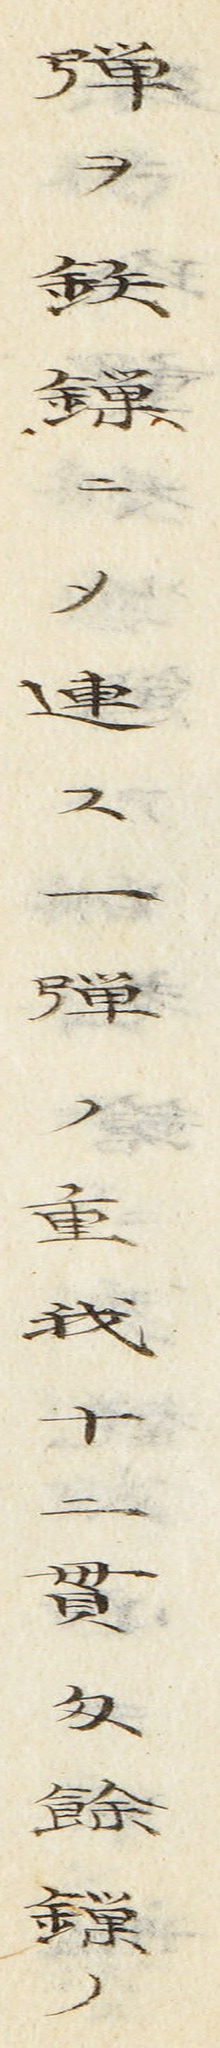弾ヲ鉄鏁ニシテ連ス一弾ノ重我十二貫匁余鏁ノ
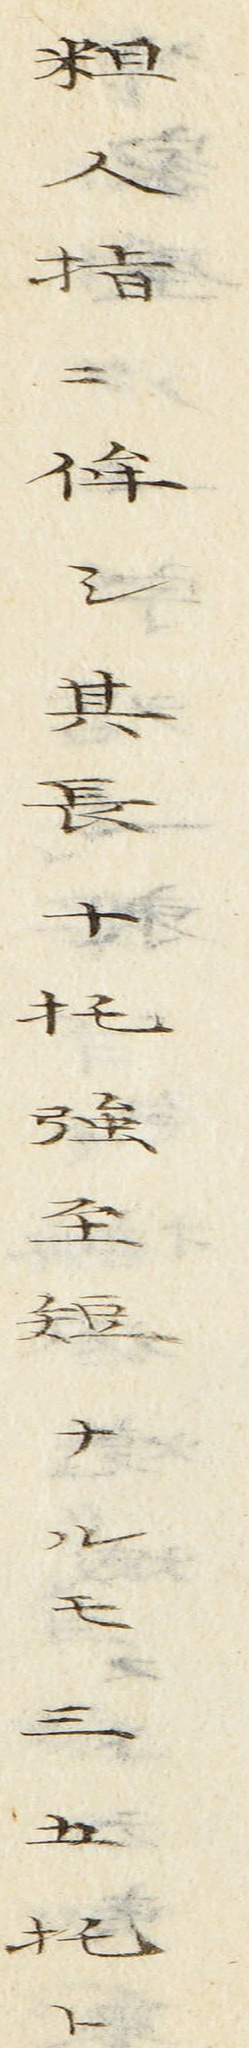粗人指ニ侔シ其長十啄托強至短ナルモ三五托ト
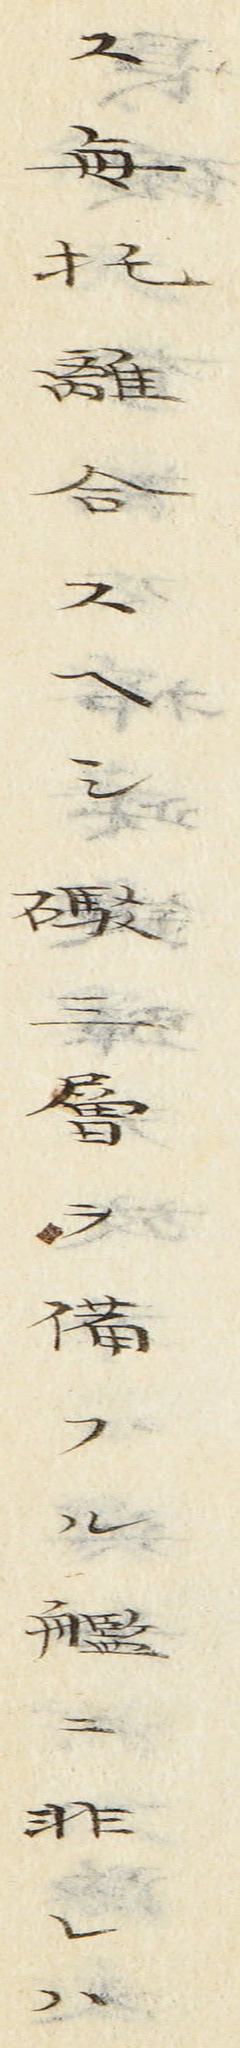ス毎托離合スヘシ礟三層ヲ備フル艦ニ非レハ

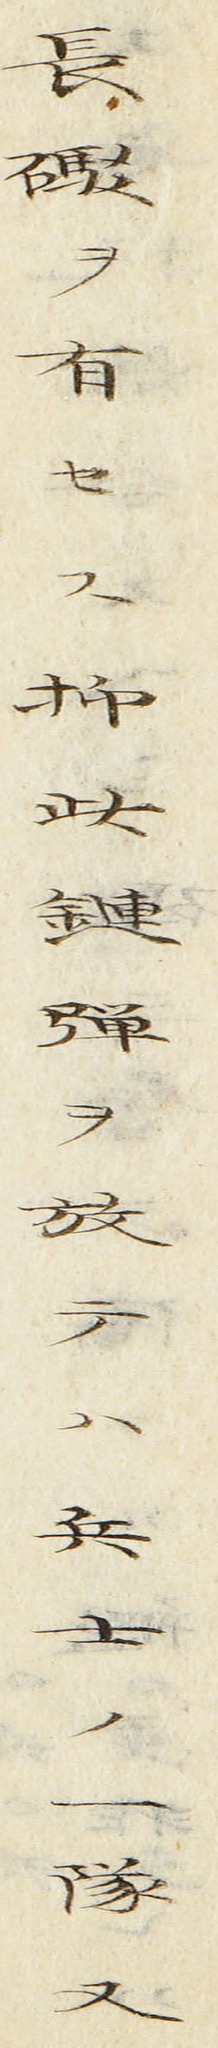長礟ヲ有セス抑此鏈弾ヲ放テハ兵士ノ一隊又
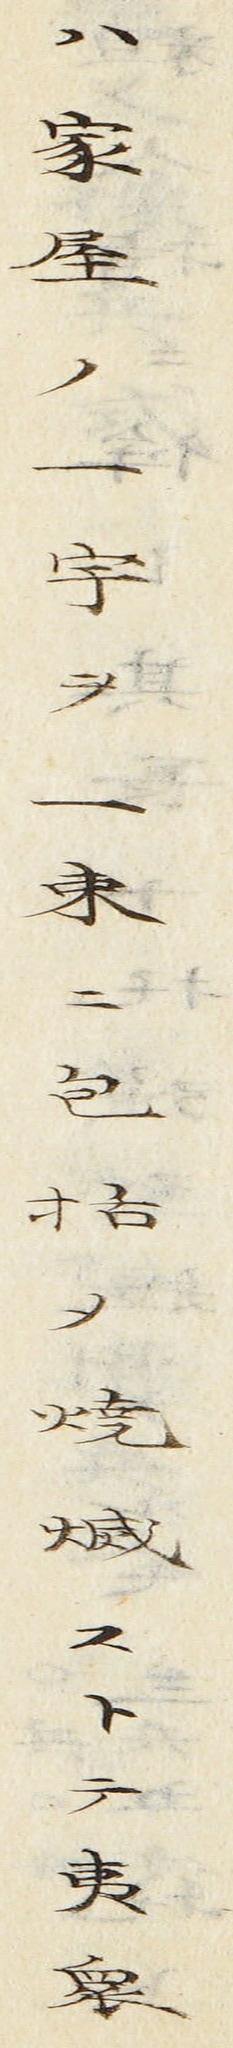ハ家屋ノ一宇ヲ一束ニ包括シテ焼滅ストテ夷衆
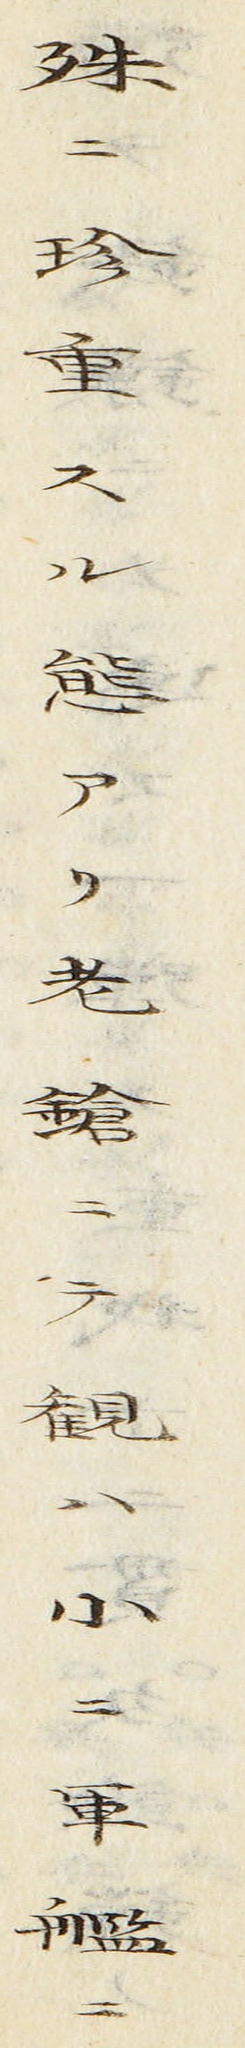殊ニ珍重スル態アリ老鎗ニテ観ハ小ニ軍艦ニ
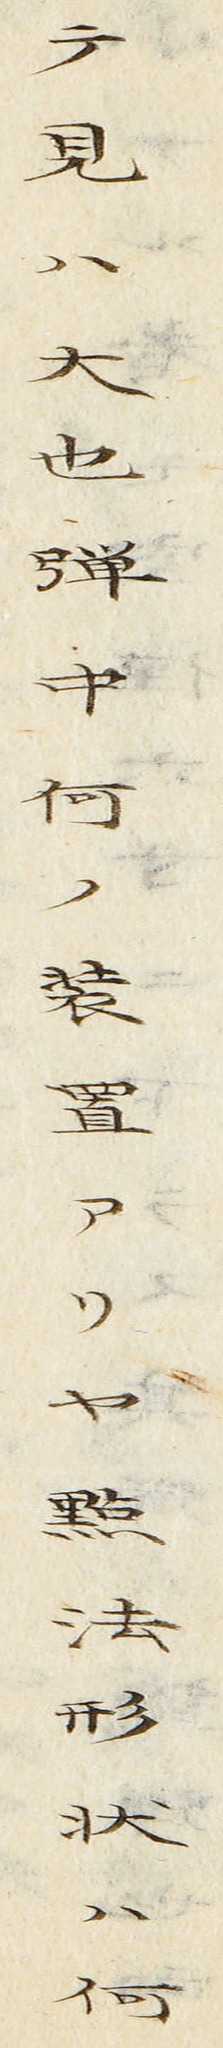テ見ハ大也弾中何ノ装置アリヤ点法形状ハ何
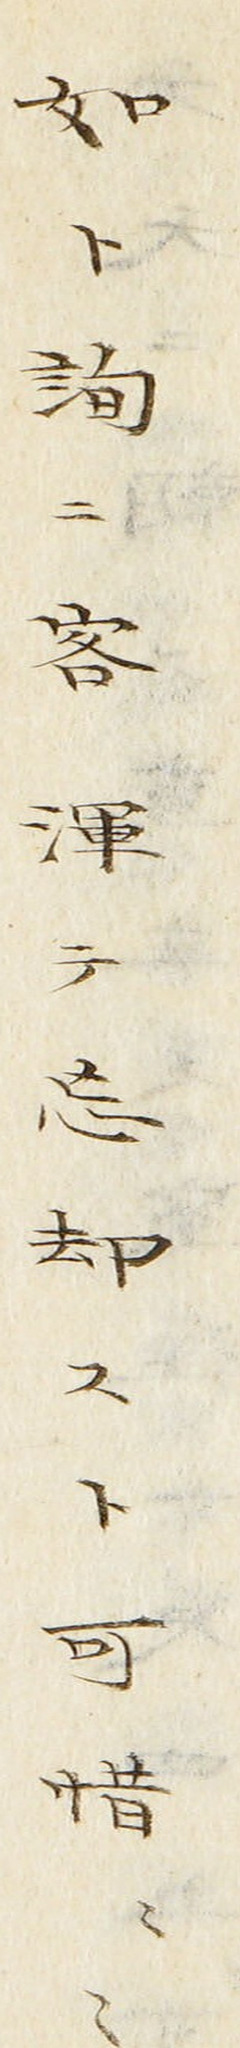如ト詢ニ客渾テ忘却スト可惜ゝゝ
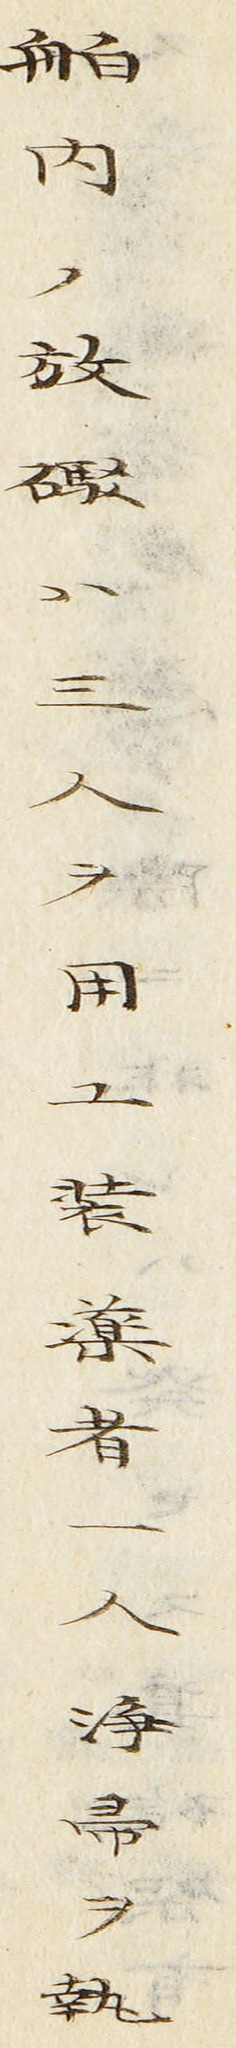〇舶内ノ放礟ハ三人ヲ用ユ装薬者一人浄帚ヲ執
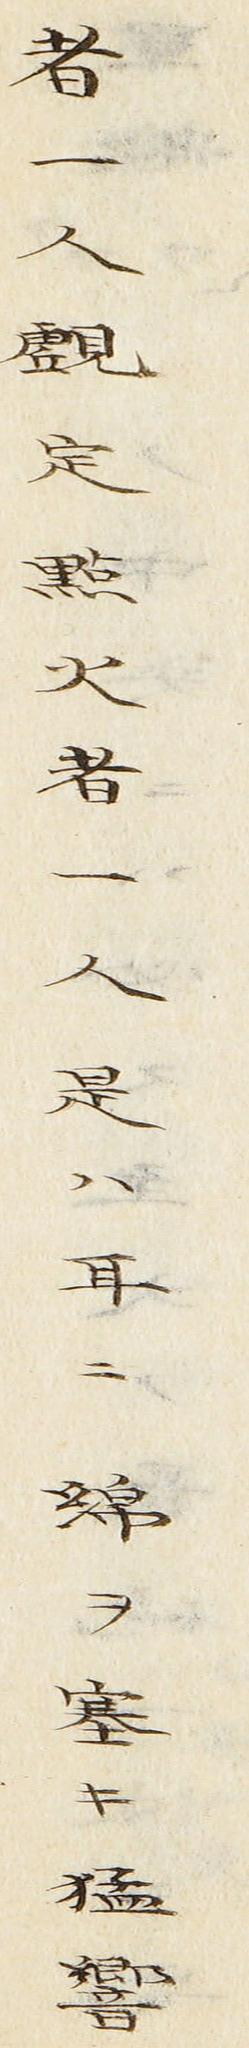者一人覷定点火者一人是ハ耳ニ綿ヲ塞キ猛響
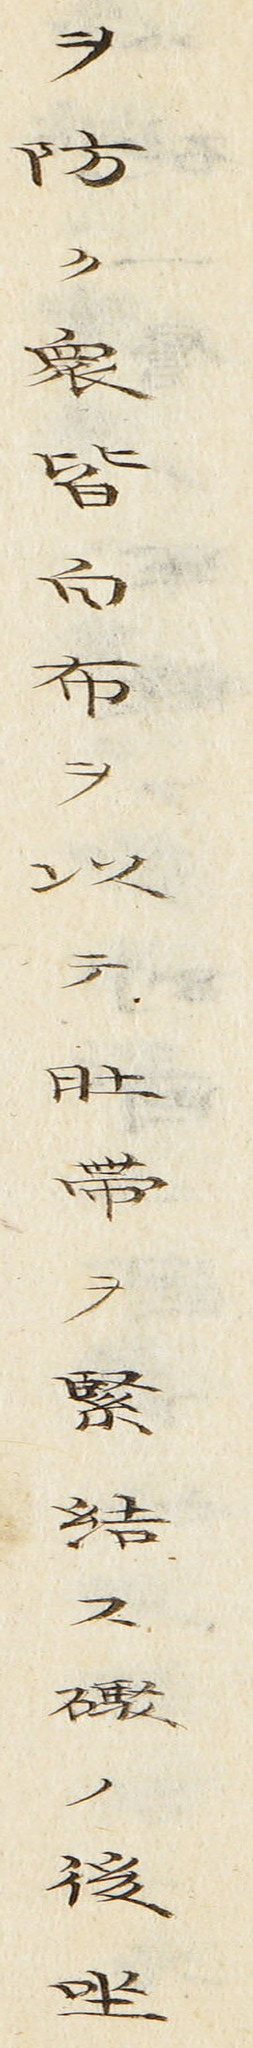ヲ防ク衆皆白布ヲ以テ肚帯ヲ緊結ス礟ノ後坐
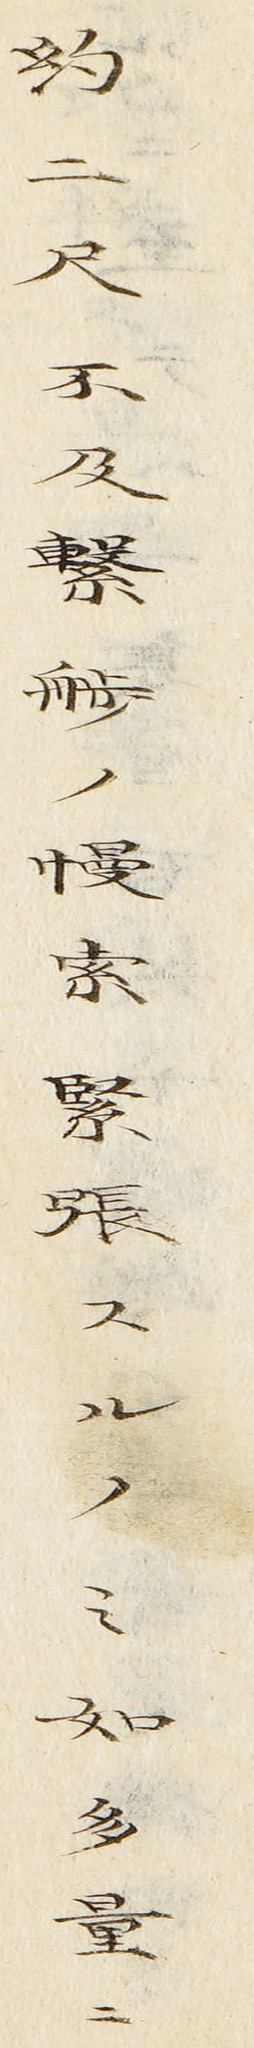約二尺不及繋ノ幔索緊張スルノミ如多量ニ
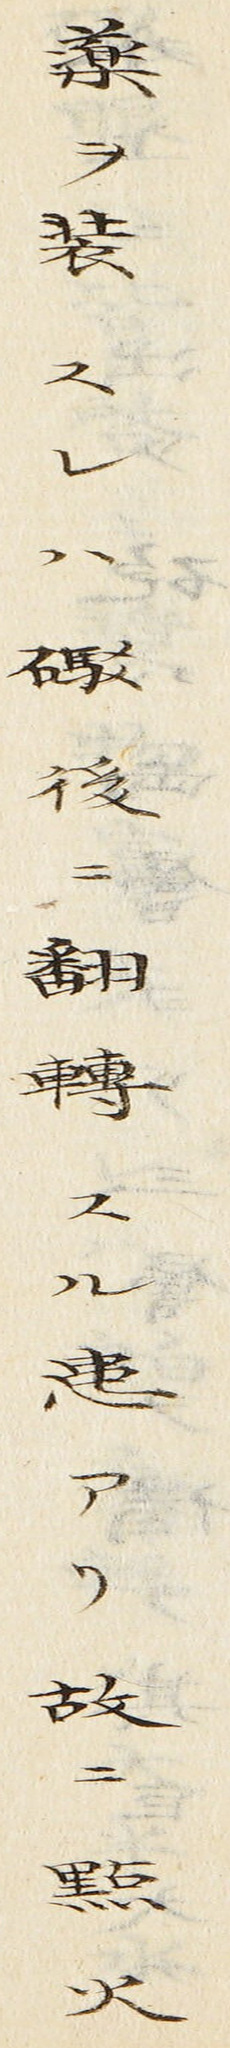薬ヲ装スレハ礟後ニ翻転スル患アリ故ニ点火
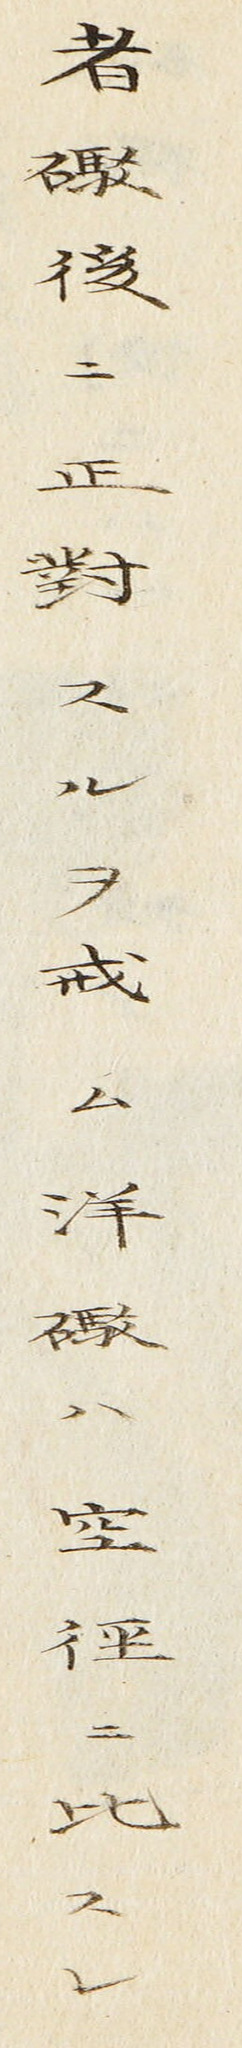者礟後ニ正対スルヲ戒ム洋礟ハ空径ニ比スレ
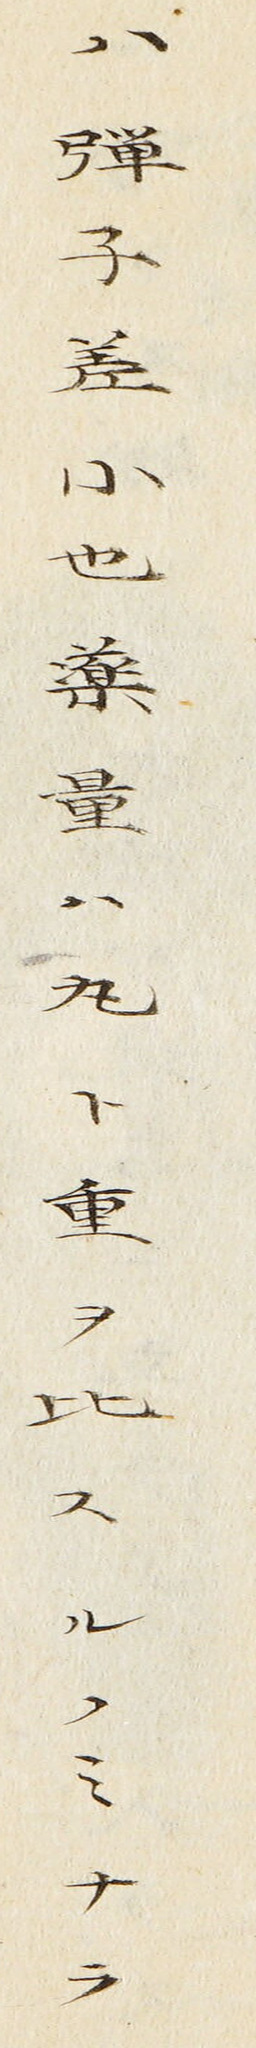ハ弾子差小也薬量ハ丸ト重ヲ比スルノミナラ
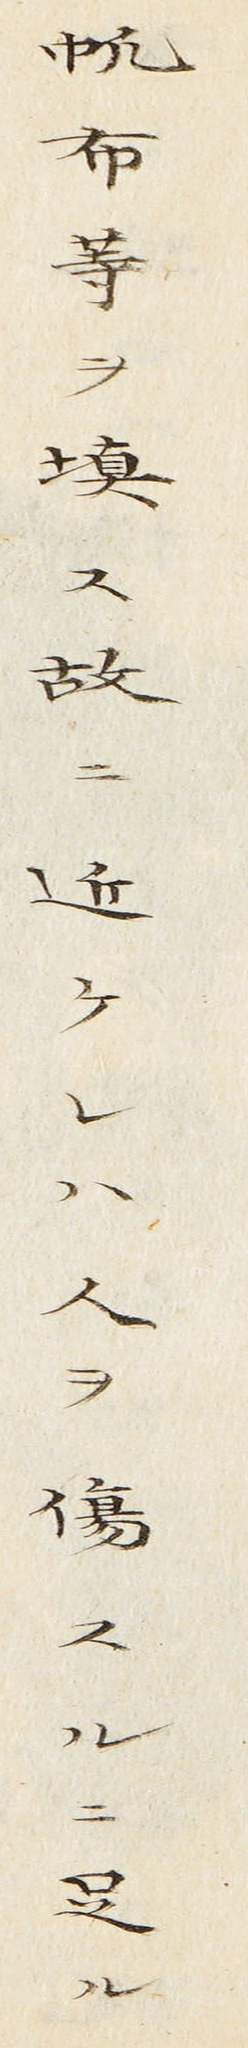帆布等ヲ填ス故ニ近ケレハ人ヲ傷スルニ足ル
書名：蕃談
